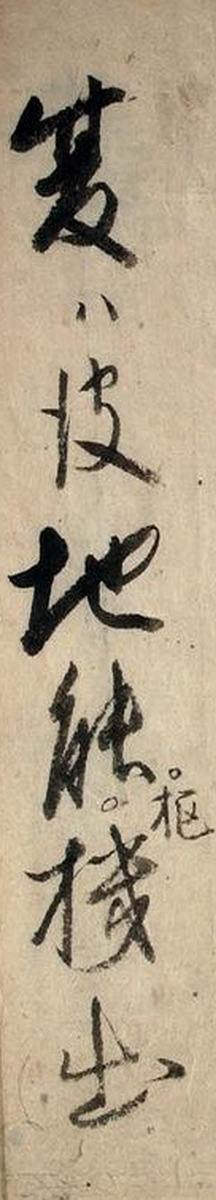夏ハ彼地能枢機出

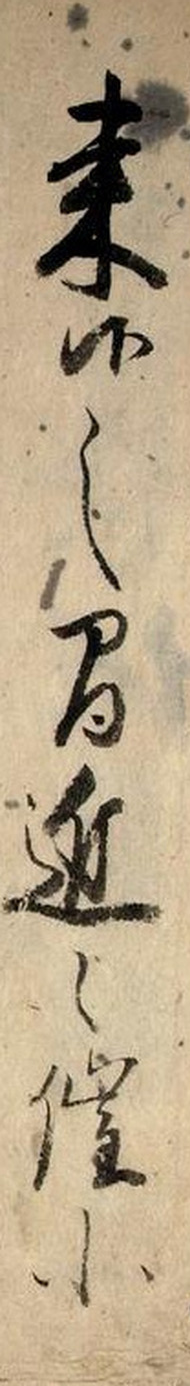来候之間近々催小
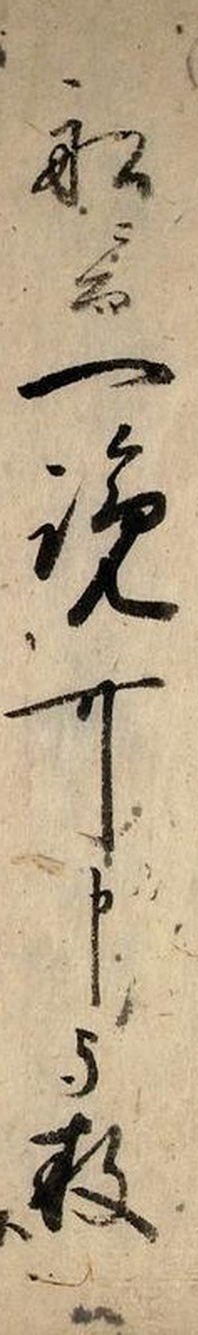船ニ而一覧可申と存候
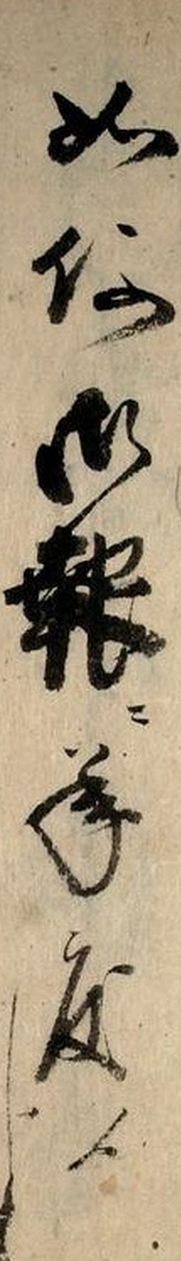如何御報ニ承度候
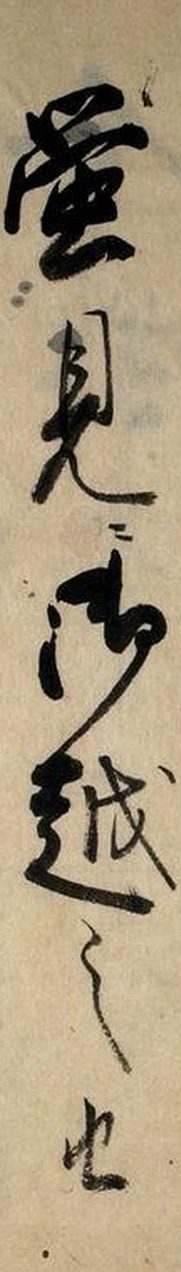蛍見ニ御越之由
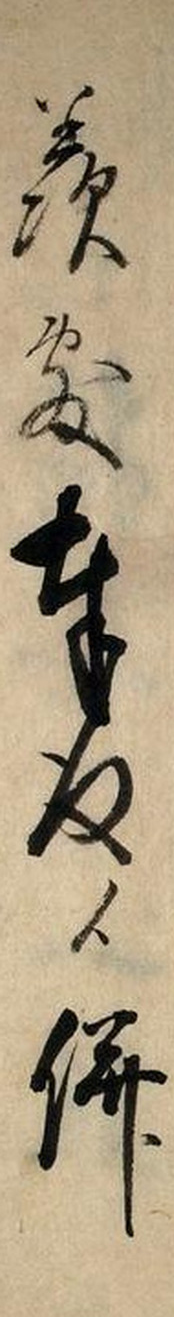羨敷奉存候併
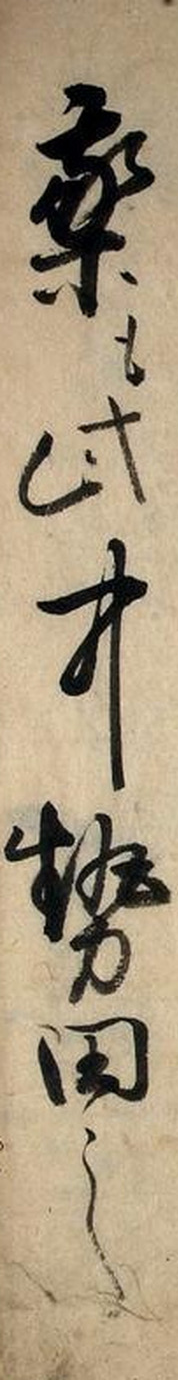我等も此中勢田之

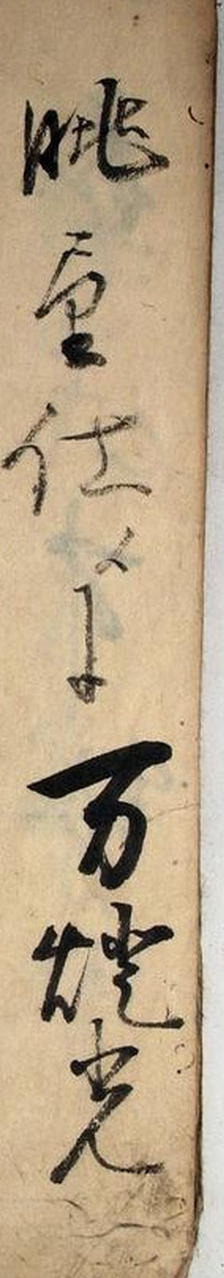眺望仕候に万燈光
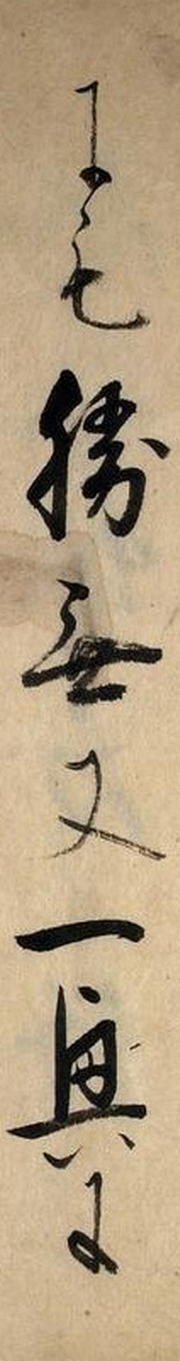にも勝無又一興に
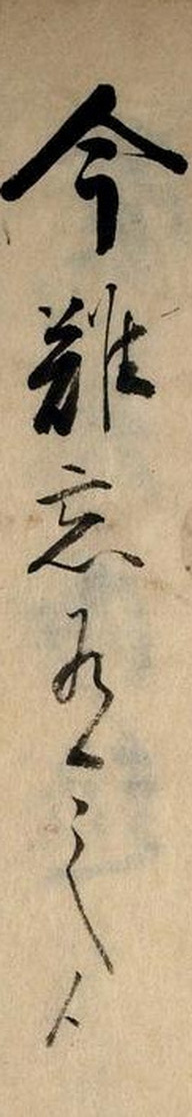今難忘有之候
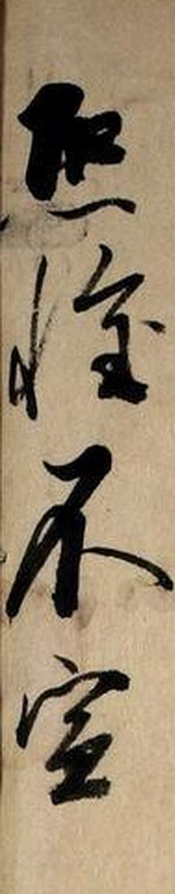恐惶不宣
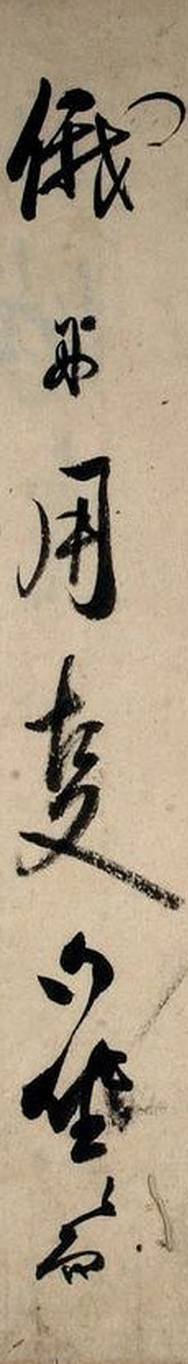俄に用事御座候而
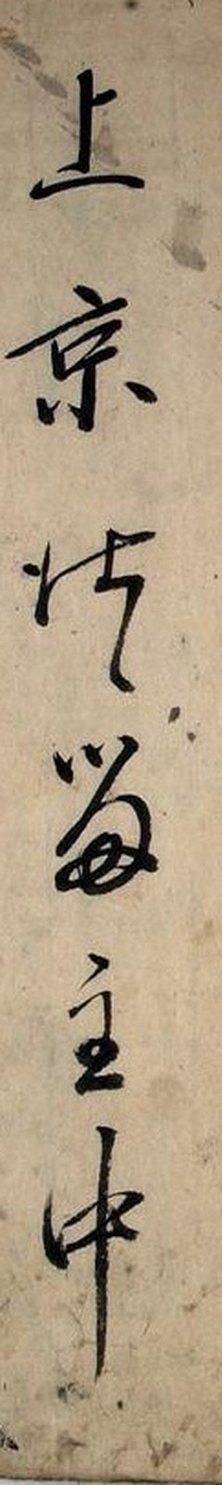上京仕候留主中

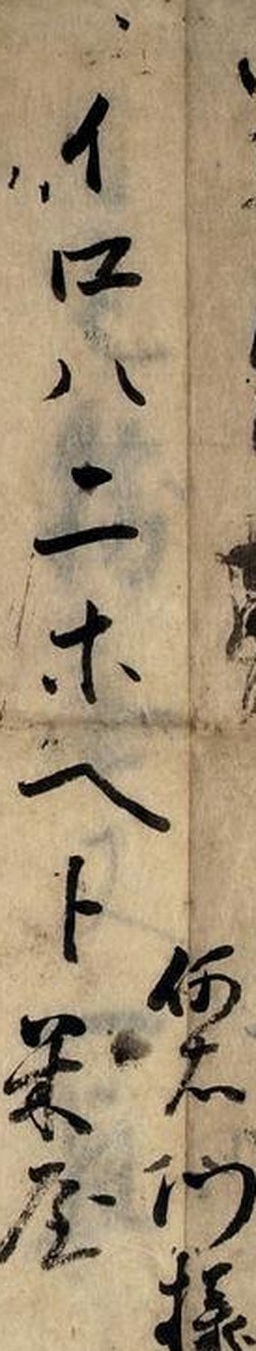イロハニホヘト米屋

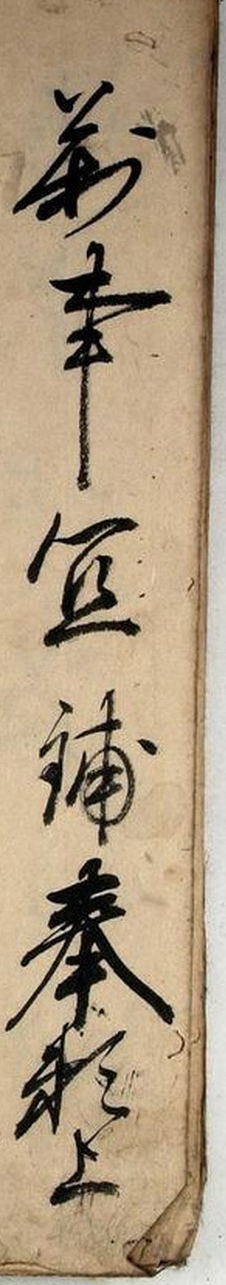万事宜鋪奉頼上
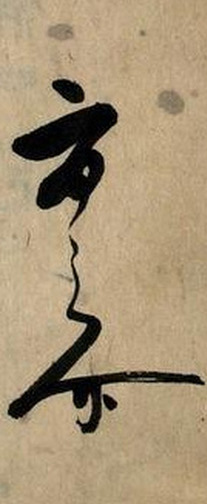市之介
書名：御手本（手習、消息文、和漢朗詠集・論語の一節）
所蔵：福井県文書館 Fukui Prefectural Archives
